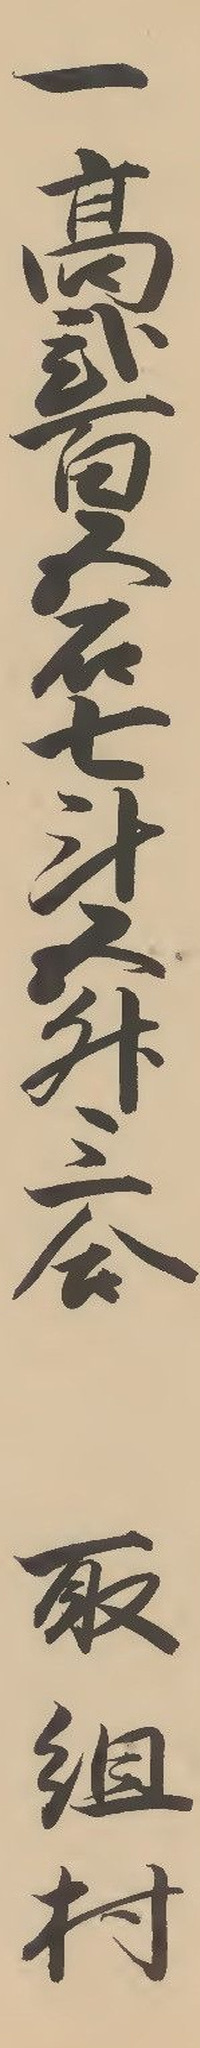一高弐百五石七斗五升三合取組村
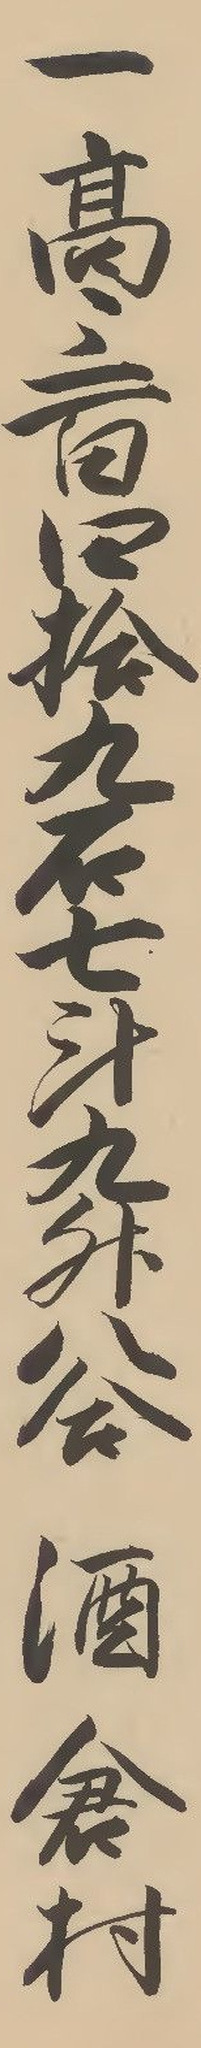一高三百四拾九石七斗九升八合酒倉村
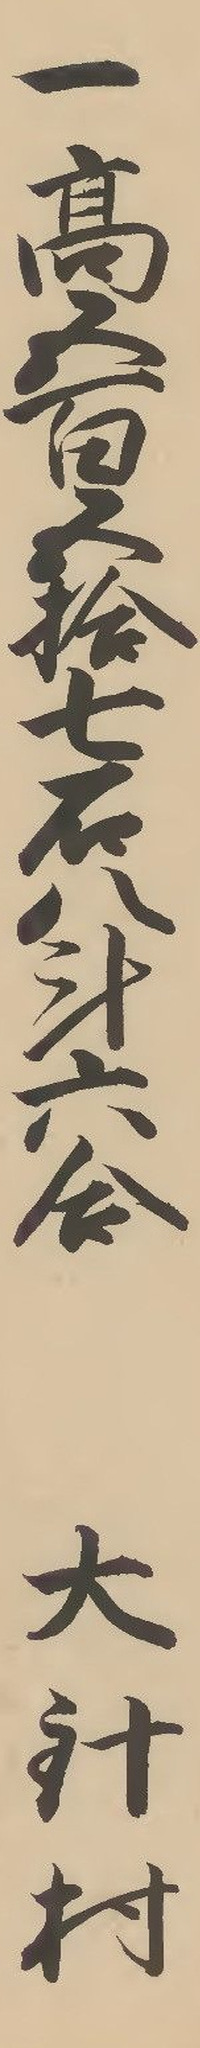一高五百五拾七石八斗六合大針村

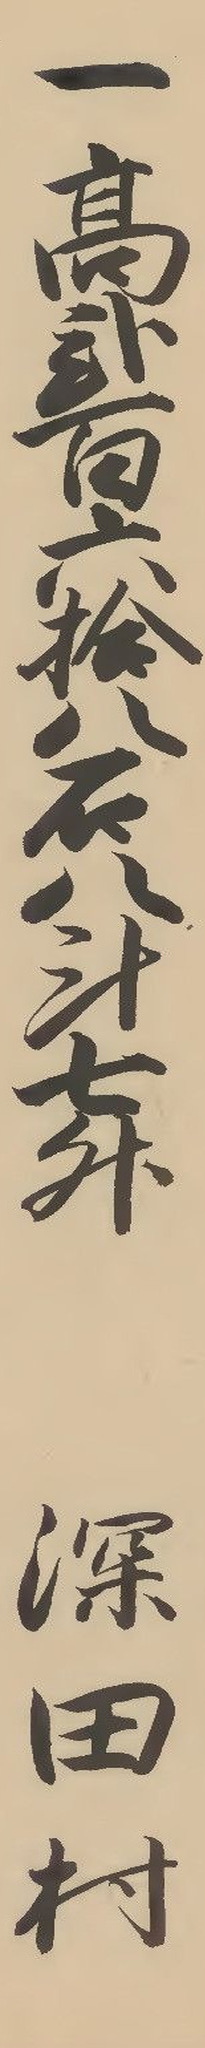一高弐百六拾八石八斗七升深田村
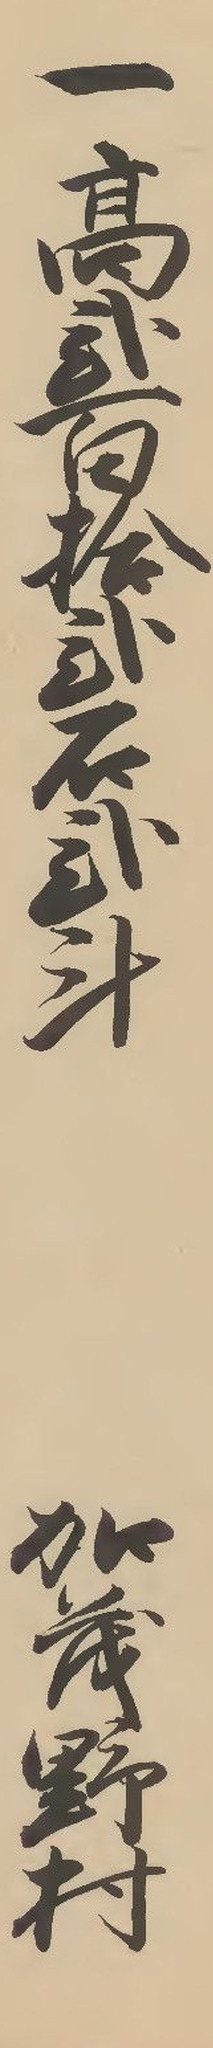一高弐百拾弐石弐斗加茂野村
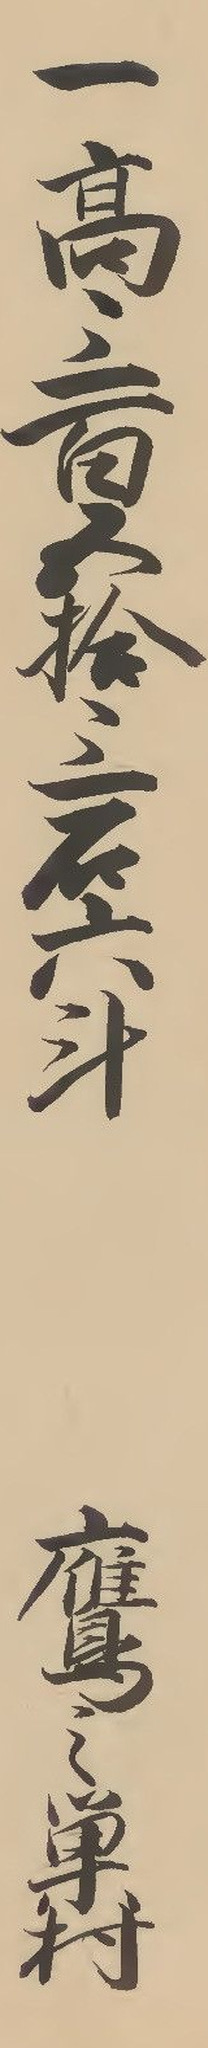一高三百五拾三石六斗鷹之巣村
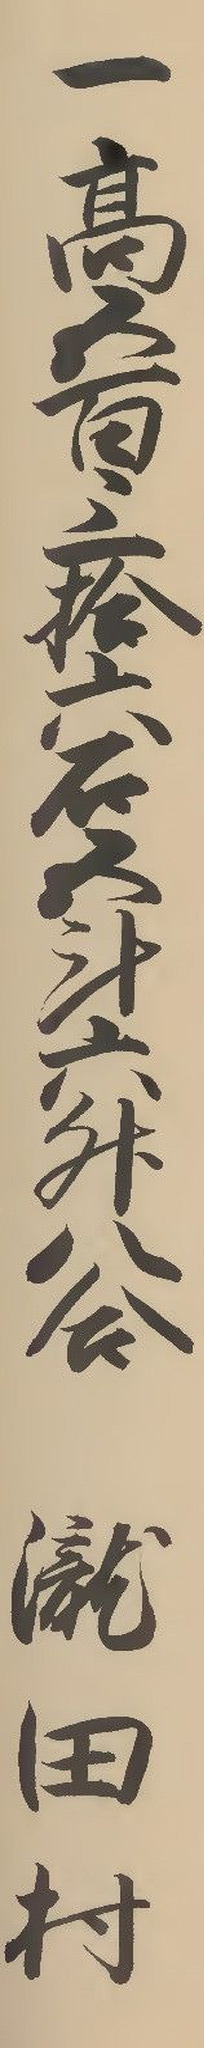一高五百三拾六石五斗六升八合滝田村
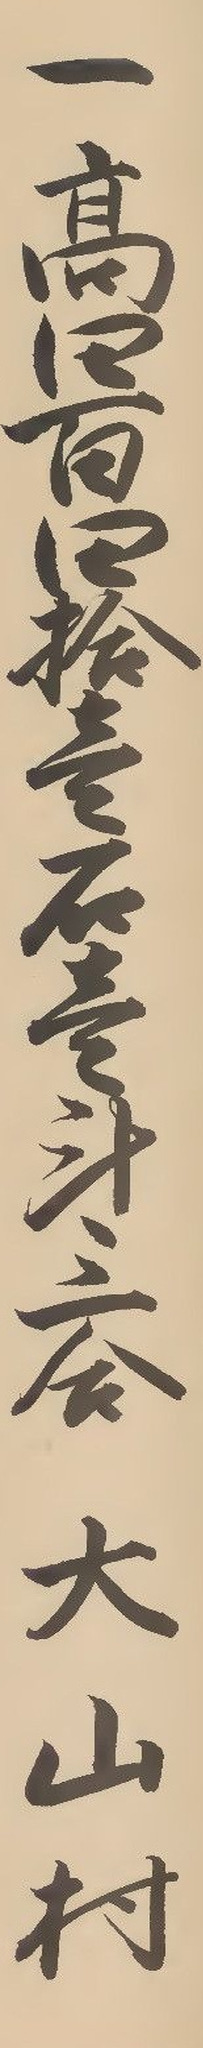一高四百四拾壱石壱斗三合大山村
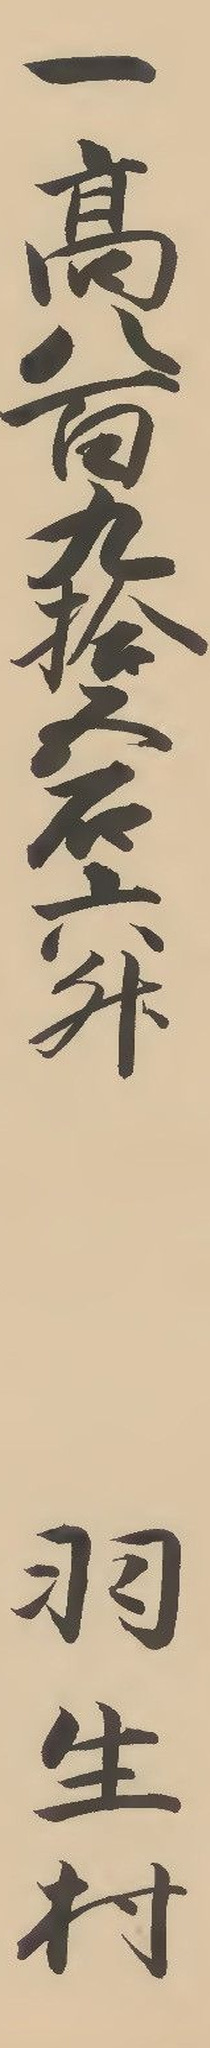一高八百九拾五石六升羽生村
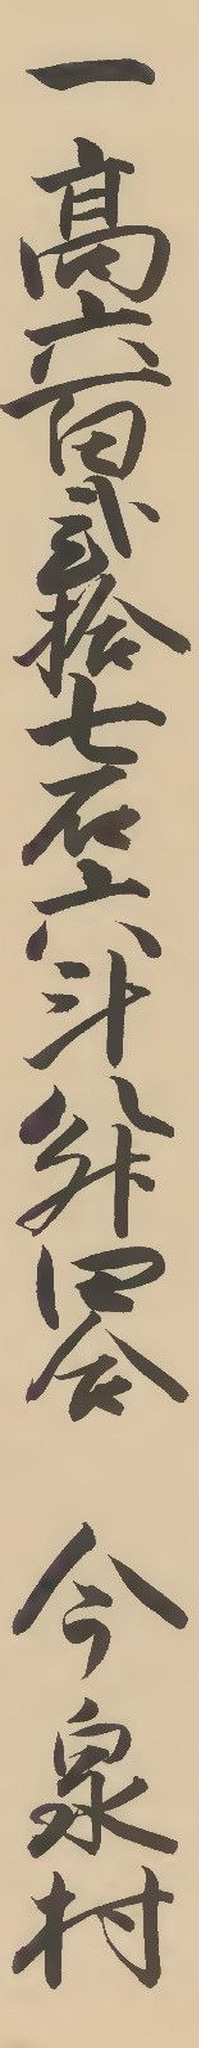一高六百弐拾七石六斗八升四合今泉村

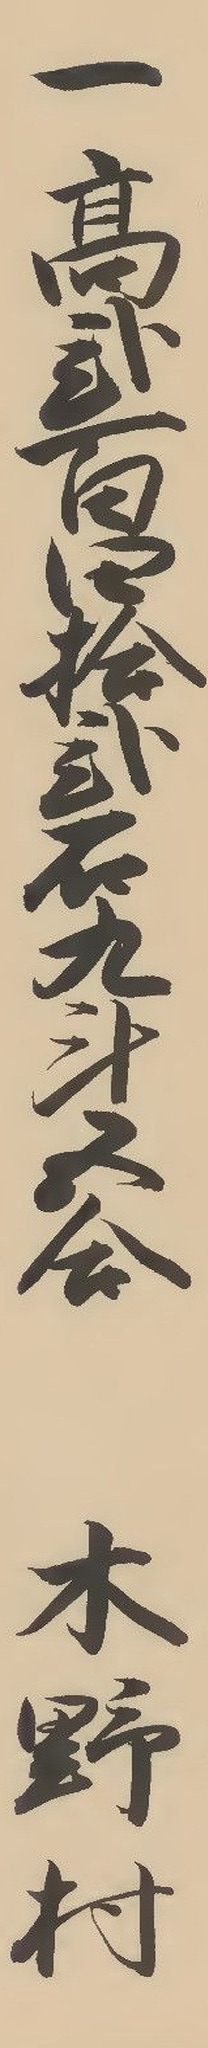一高弐百四拾弐石九斗五合木野村
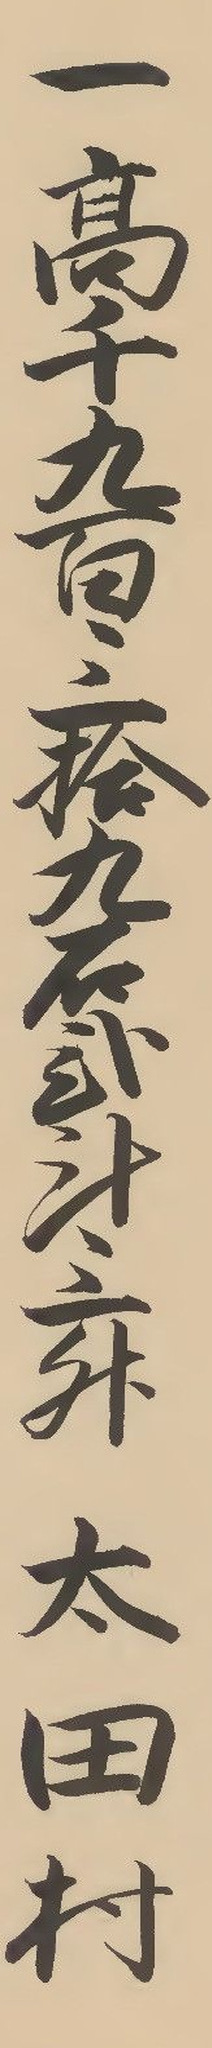一高千九百三拾九石弐斗三升太田村
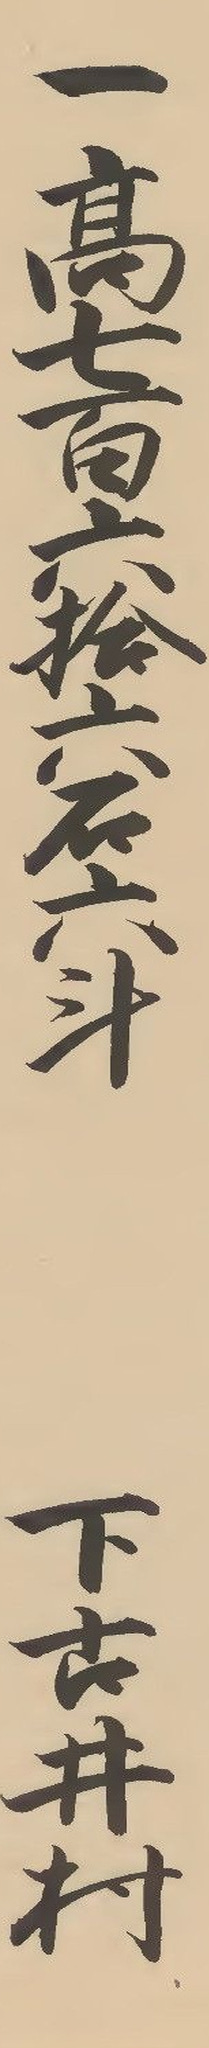一高七百六拾六石六斗下古井村
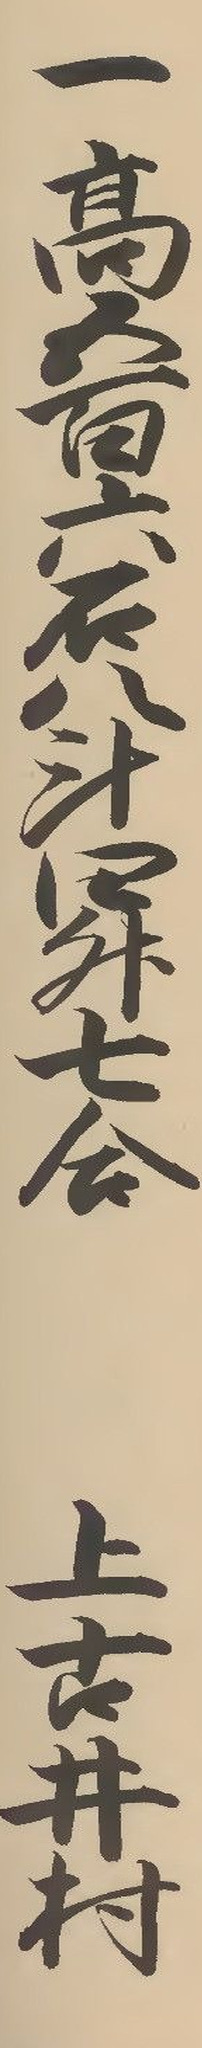一高五百六石八斗四升七合上古井村
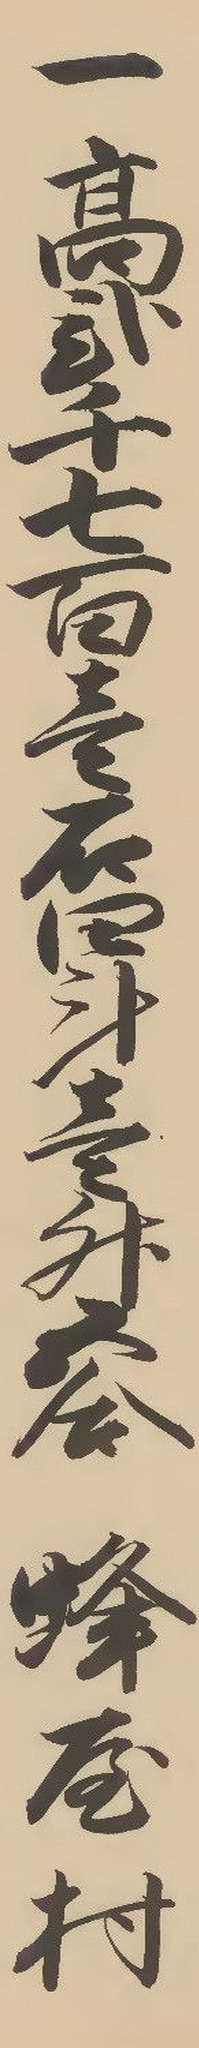一高弐千七百壱石四斗壱升五合蜂屋村

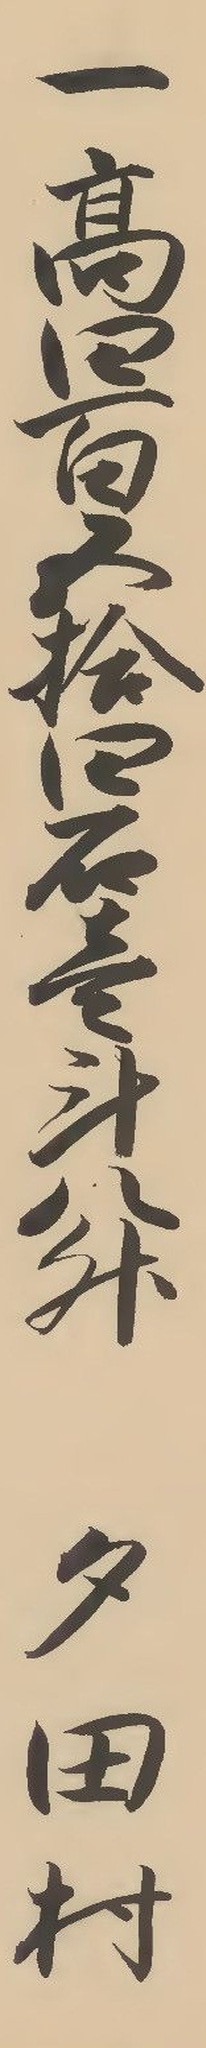一高四百五拾四石壱斗八升夕田村
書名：美濃国郷帳
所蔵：国立公文書館 National Archives of Japan
